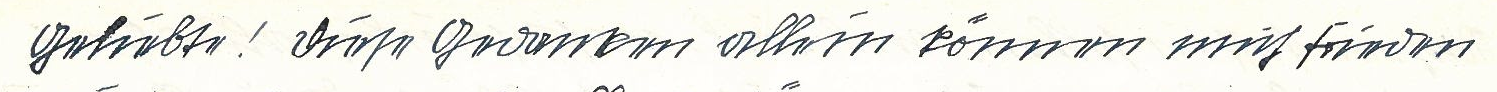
Geliebte! Diese Gedanken allein können mich Frieden
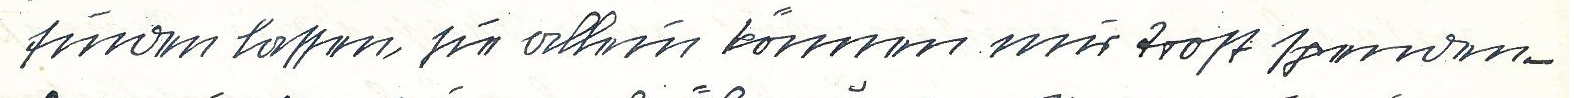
finden lassen, sie allein können mir Trost spenden –
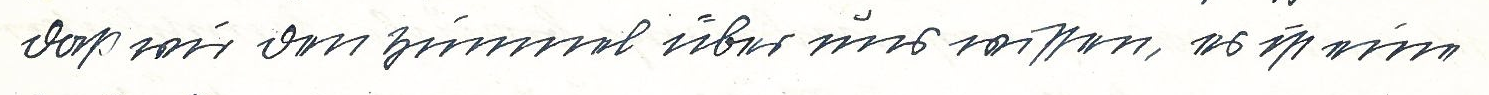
daß wir den Himmel über uns wissen, es ist eine
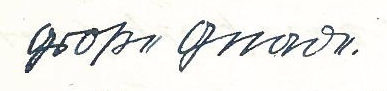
große Gnade.
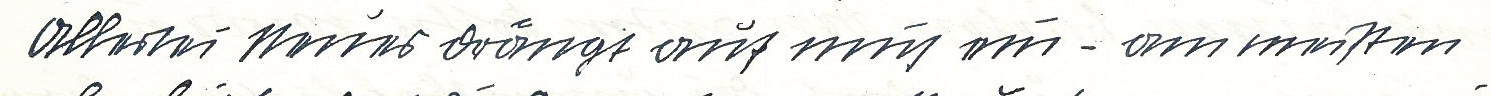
Allerlei Neues drängt auf mich ein – am meisten
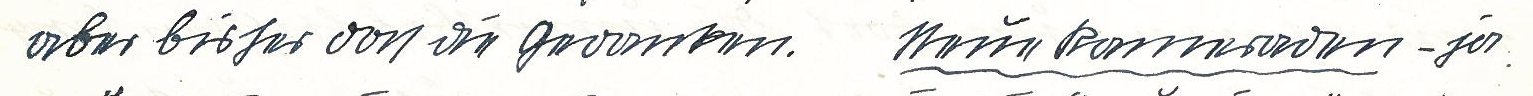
aber bisher doch die Gedanken. Neue Kameraden – ja
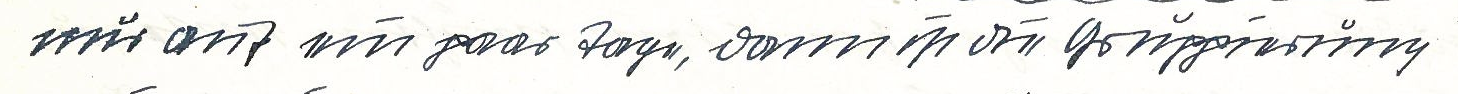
nur auf ein paar Tage, dann ist die Gruppierung
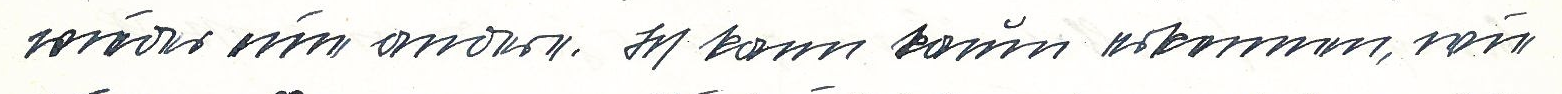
wieder eine andere. Ich kann kaum erkennen, wie
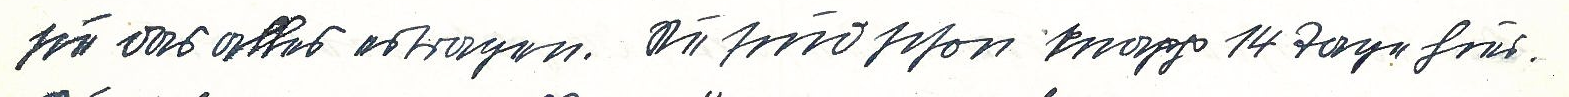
sie das alles ertragen. Sie sind schon knapp 14 Tage hier.
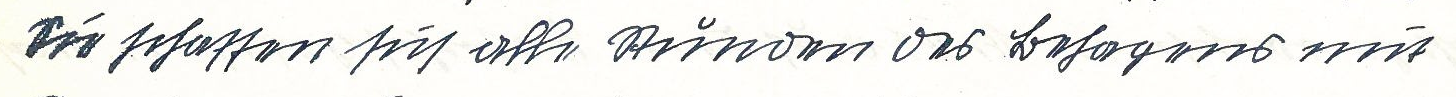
Sie schaffen sich alle Stunden des Behagens mit
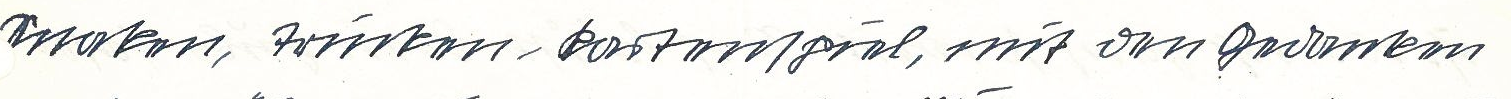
naken, Trinken, Kartenspiel, mit den Gedanken
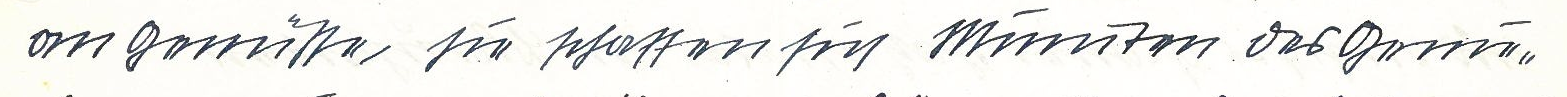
an Genüsse, sie schaffen sich Minuten des Genie¬
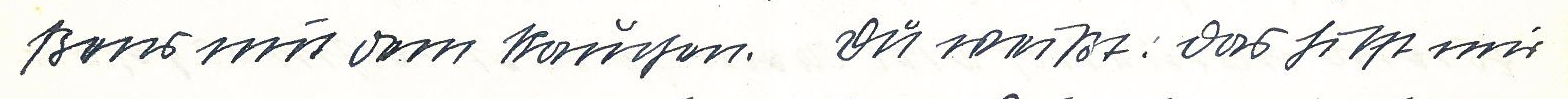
ßens mit dem Rauchen. Du weißt: das hilft mir
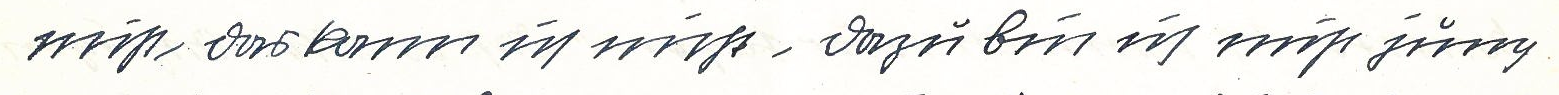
nicht, das kann ich nicht, dazu bin ich nicht jung
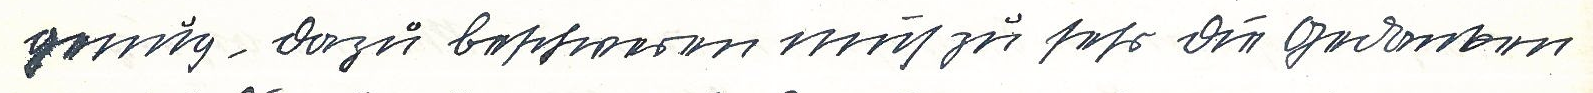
genug, dazu beschweren mich zu sehr die Gedanken
